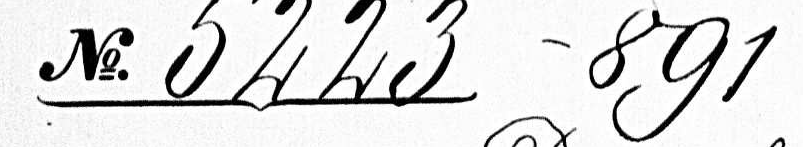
No. 5223 – 891
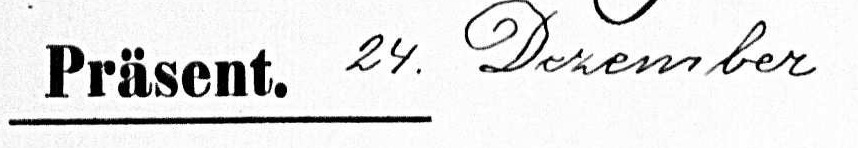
Präsent. 24. Dezember
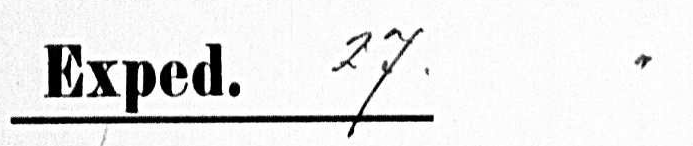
Expedit 27. „
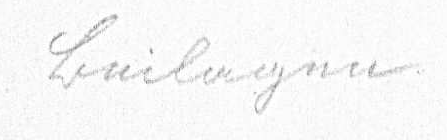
Beilagen
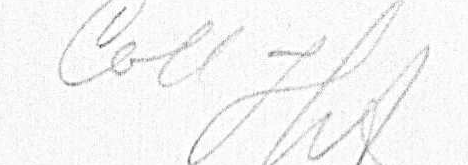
Coll HA
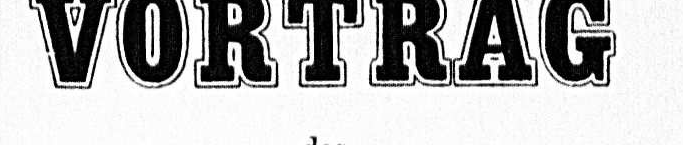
Vortrag
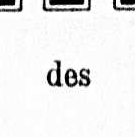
Des
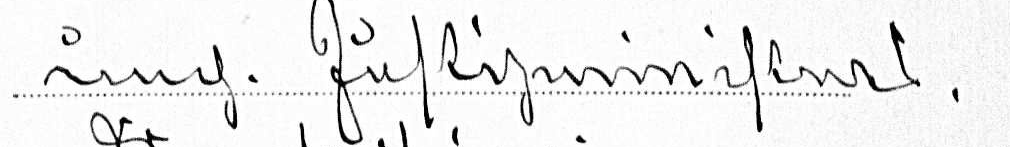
ung. Justizministers
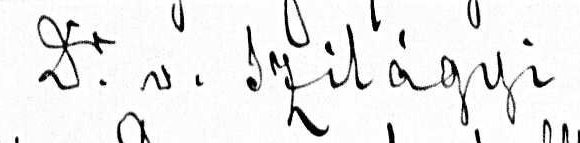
Dr. v. Szilágyi
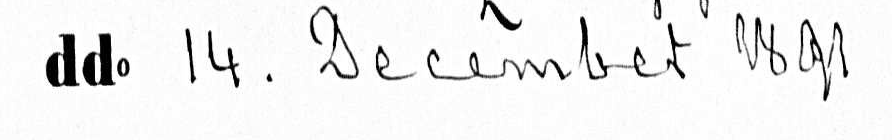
Ddo 14. December 1891
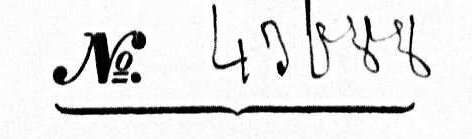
No. 43688
